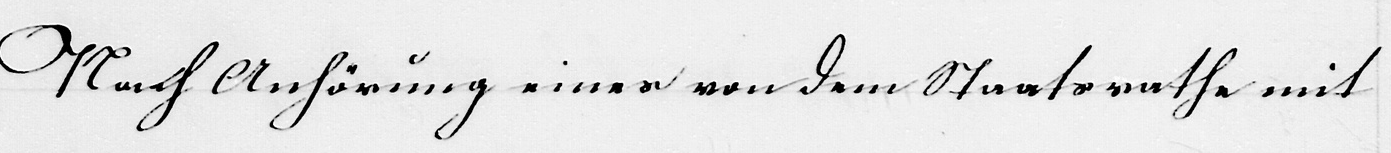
Nach Anhörung eines von dem Staatsrathe mit
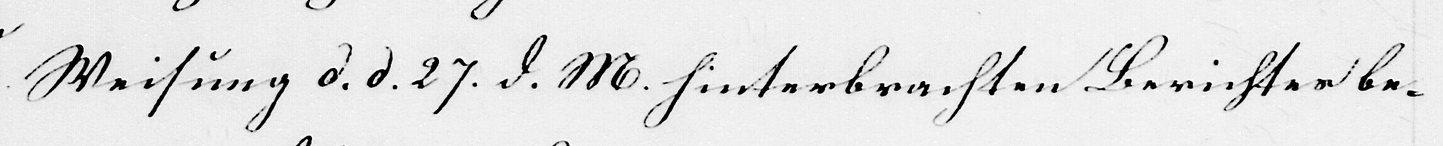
Weisung d. d. 27. d. M. hinterbrachten Berichtes be¬
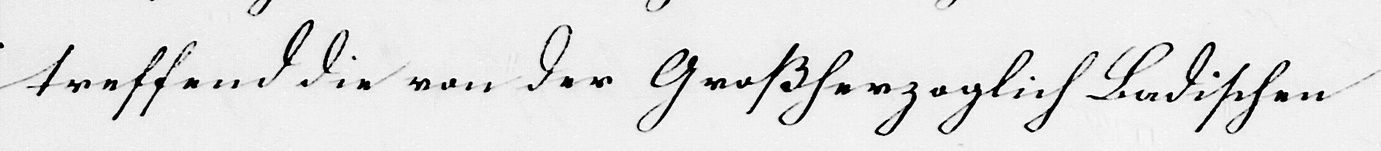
treffend die von der Großherzoglich Badischen
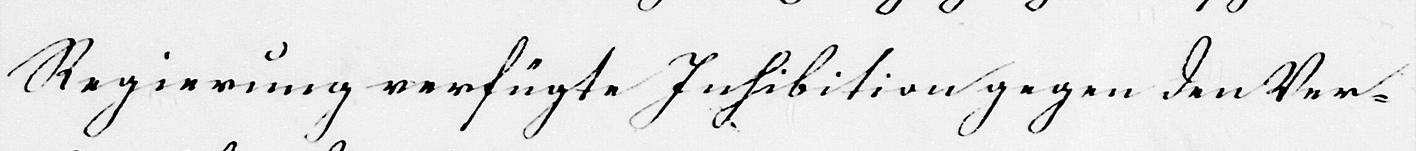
Regierung verfügte Inhibition gegen den Ver¬
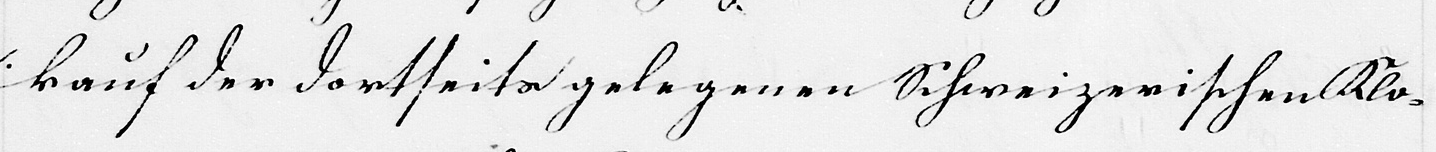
kauf der dortseits gelegenen Schweizerischen Klo¬
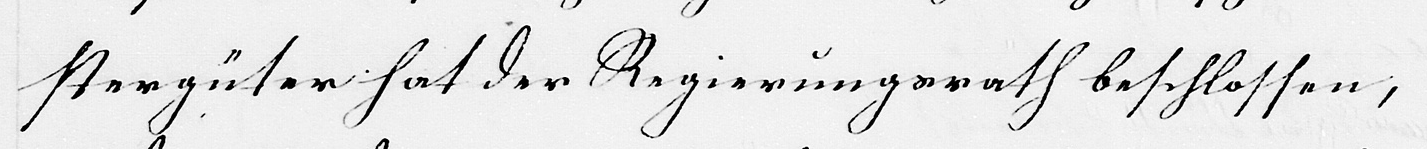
stergüter hat der Regierungsrath belschlossen,
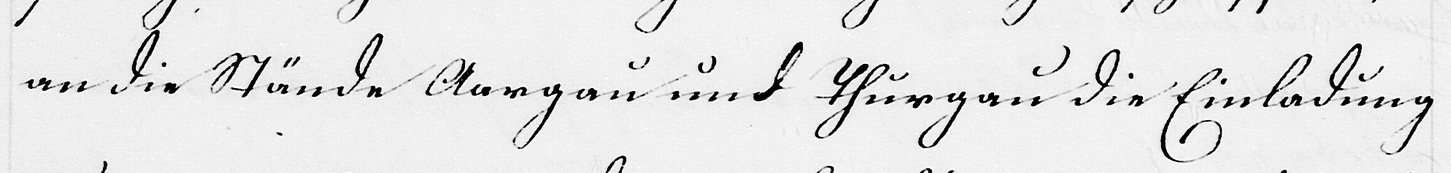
an die Stände Aargau und Thurgau die Einladung
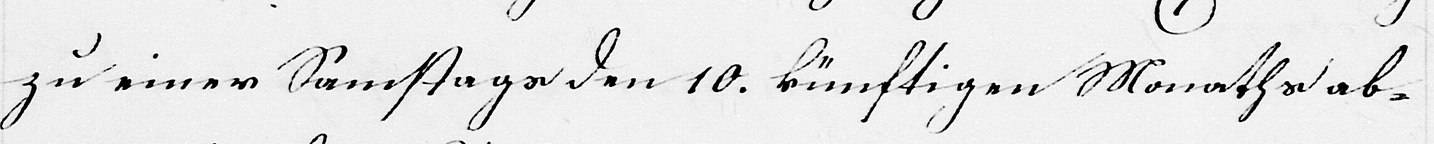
zu einer Samstags den 10. künftigen Monaths ab¬
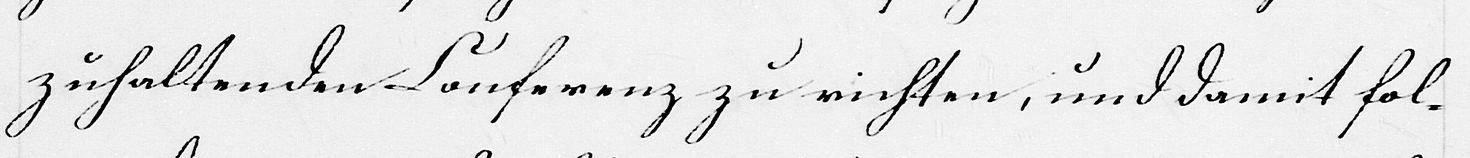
zuhaltenden Conferenz zu richten, und damit fol¬
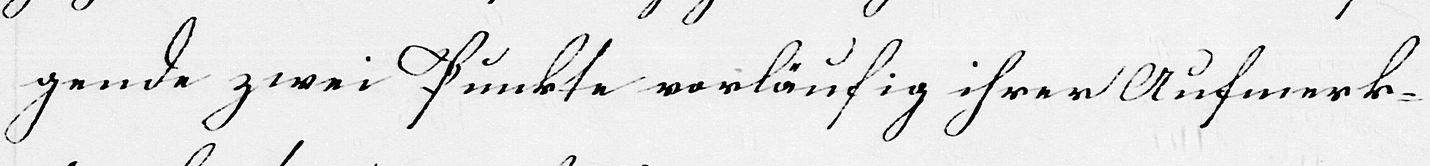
gende zwei Punkte vorläufig ihrer Aufmerk¬
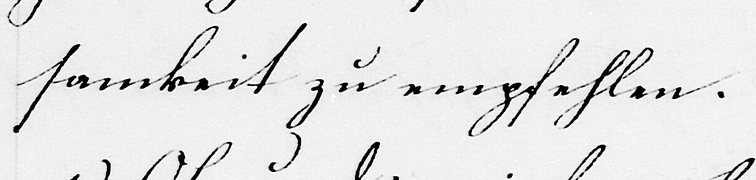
samkeit zu empfehlen.
